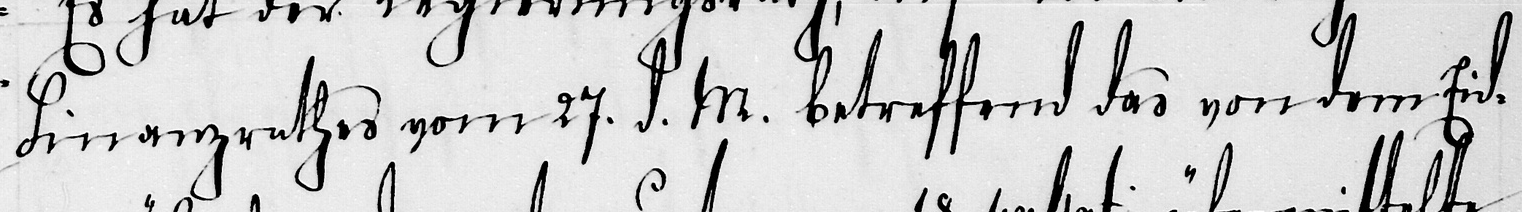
Finanzrathes vom 27. d. M. betreffend das von dem Eid¬
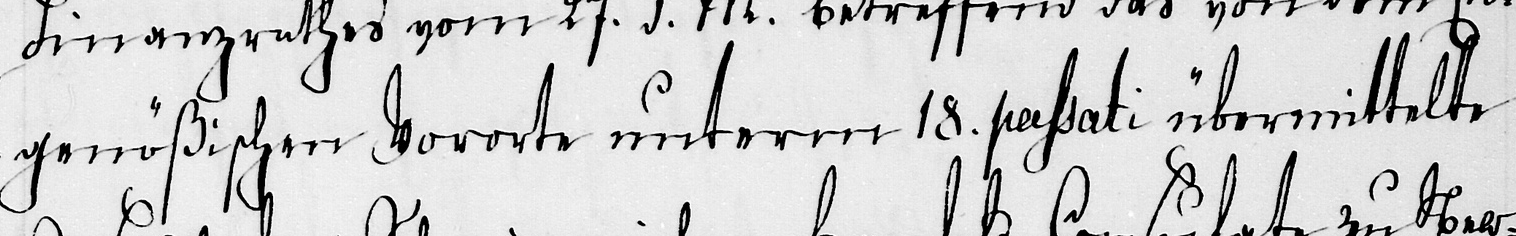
genößischen Vororte unterm 18. passati übermittelte
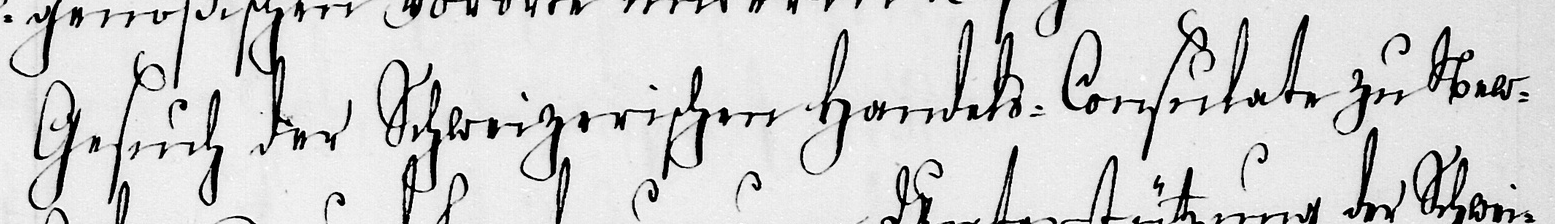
Gesuch der Schweizerischen Handels-Consulate zu New-O¬
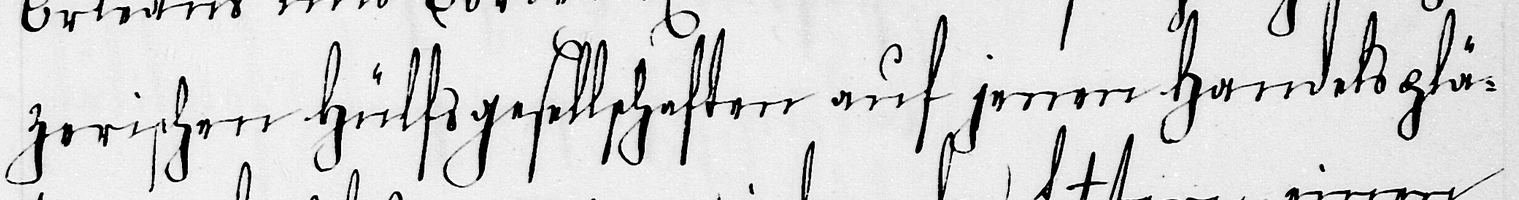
zerischen Hülfsgesellschaften auf jenen Handelsplä¬
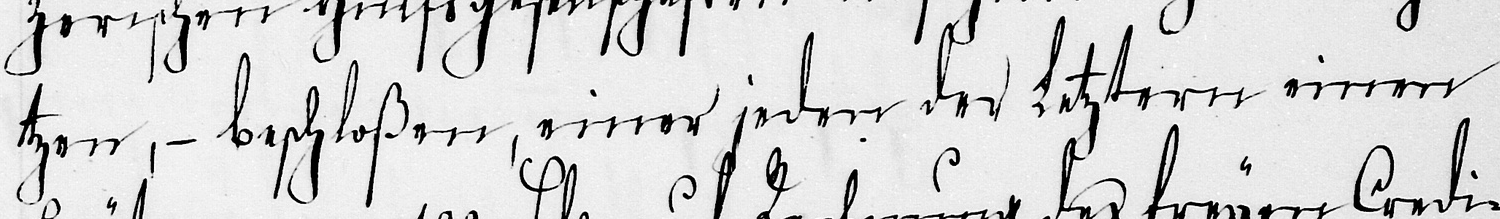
tzen, – beschloßen, einer jeden der Letztern einen
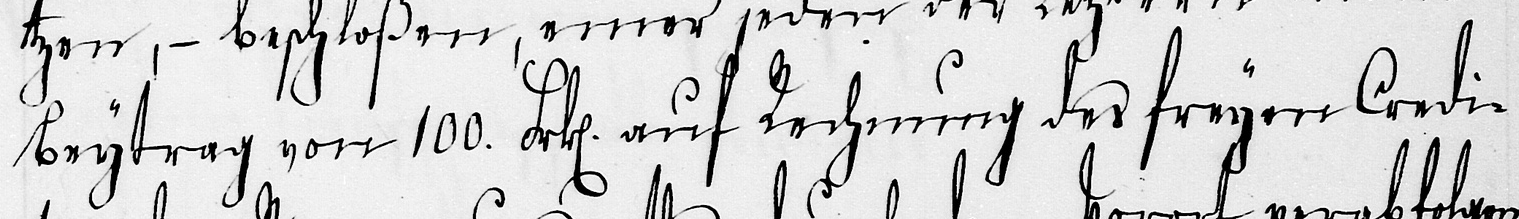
Beytrag von 100. Frk[en]. auf Rechnung des freyen Credi¬
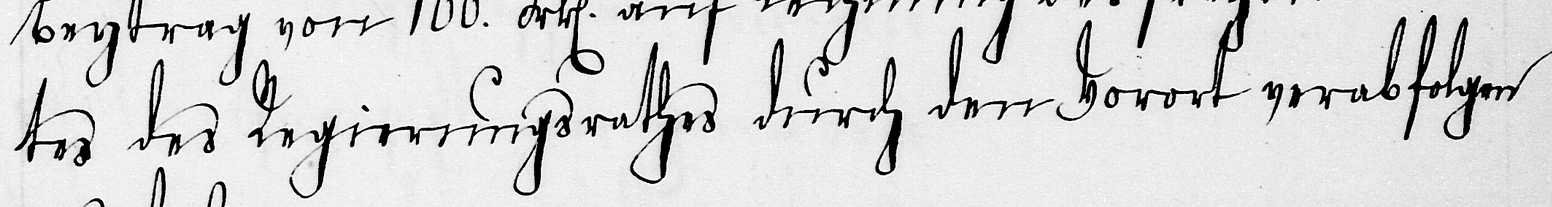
tes des Regierungsrathes durch den Vorort verabfolgen
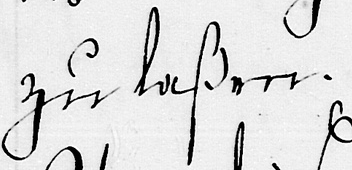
zu laßen.
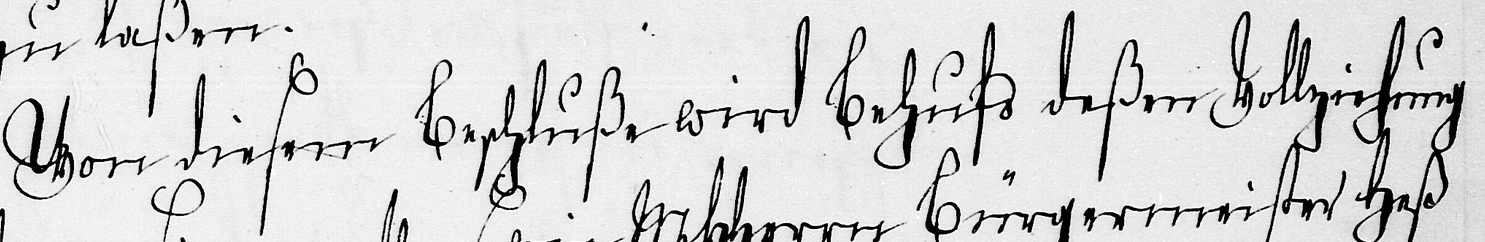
Von diesem Beschluße wird Behufs deßen Vollziehu¬
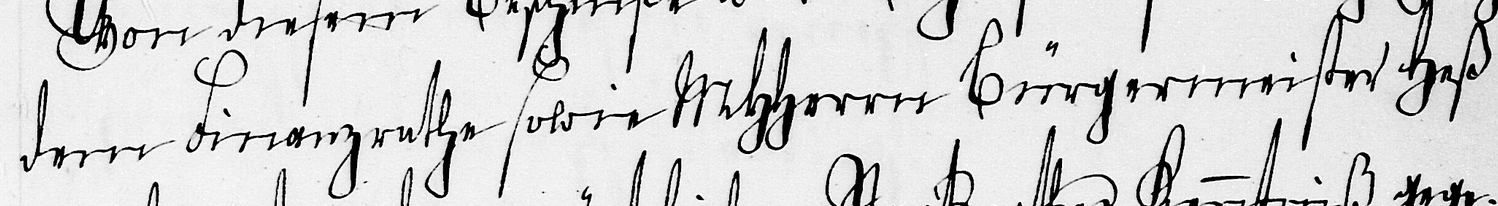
dem Finanzrathe sowie MHHerrn Bürgermeister Heß
